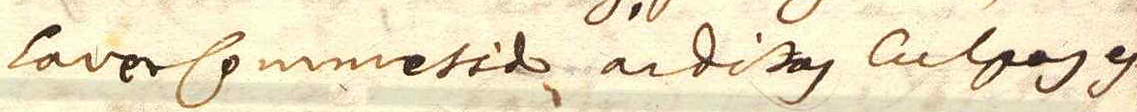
haver Commetido, as ditas Culpas es
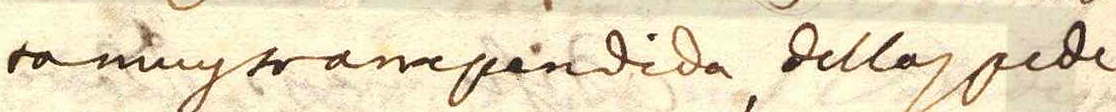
ta muyto arrependida, dellas pede
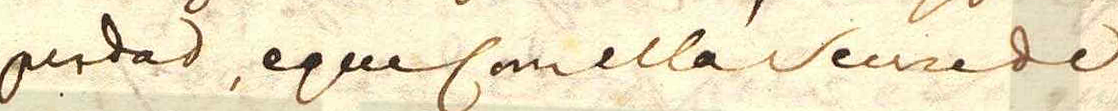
perdaõ, e que Com ella se uze de
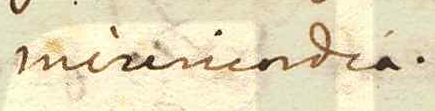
mizericordia.
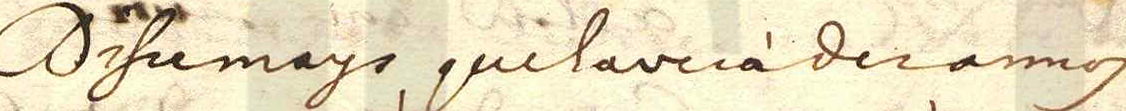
Disse mays, que haverá dez annos
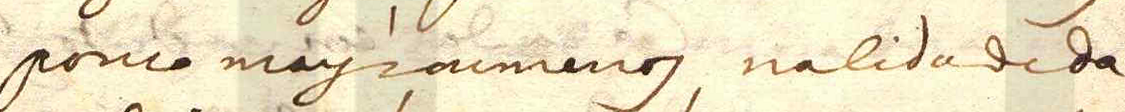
pouco mays, ou menos, na cidade da
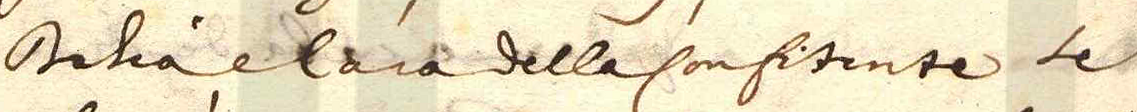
Bahia, e Caza della Confitente se
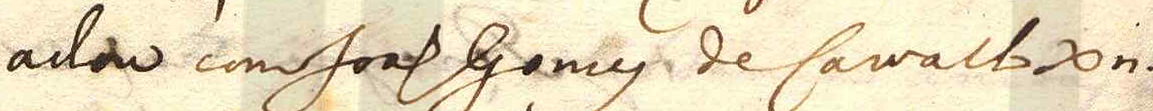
achou com Joaõ Gomes de Carvalho x n.
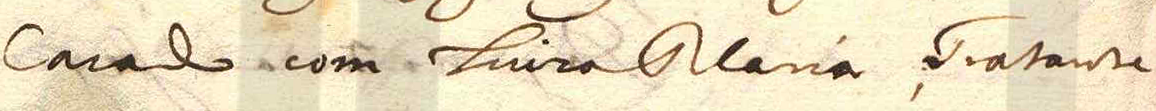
Cazado com Luiza Maria, Tratante
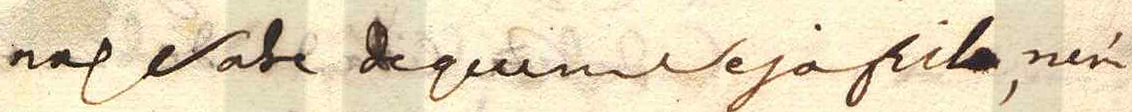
naõ sabe de quem seja filho, nem
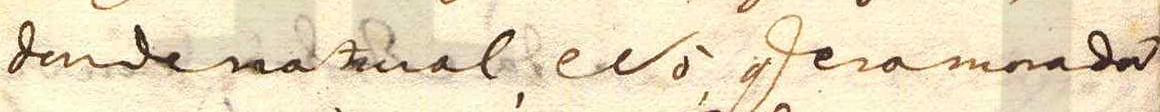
donde natural, e só, q̄ era morador
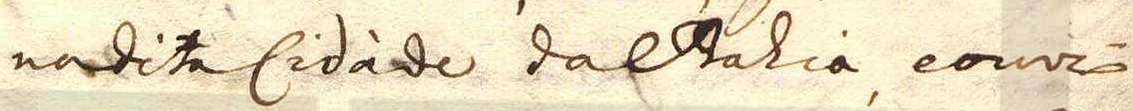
na dita Cidade da Bahia, e ouvio
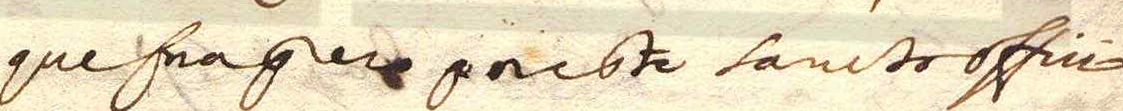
que fora prezo por este sancto officio
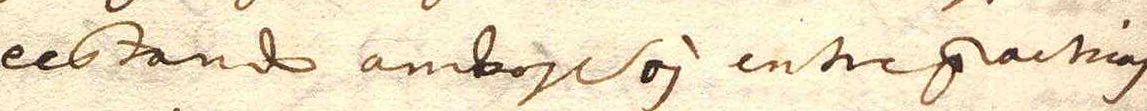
e estando ambos sós entre praticas
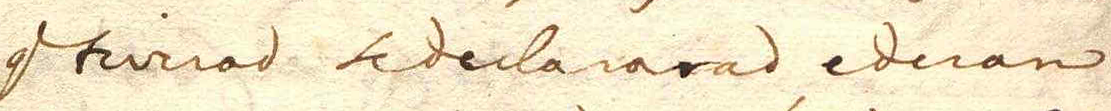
q̄ tiveraõ se declararaõ, e deran
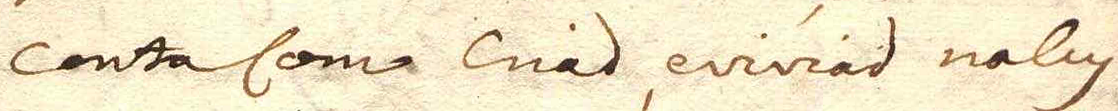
conta Como criaõ, e viviaõ na ley
